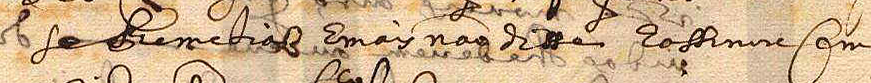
se Remetiaõ E mais não disse E assinou Com
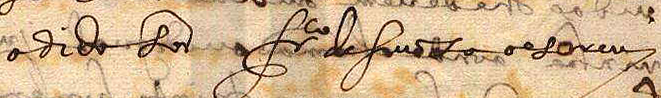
o dito sor̄ frco de souza o escreuj
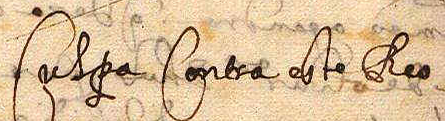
Culpa Contra este Reo
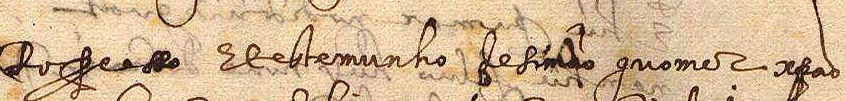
Do ꝓcesso E testemunho de simão guomez xpão
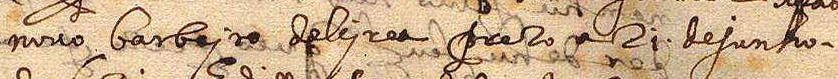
nouo barbejro de lejrea prezo a 2i. de junho
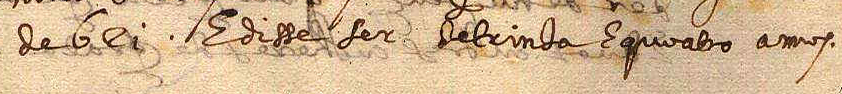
de 62i. E disse ser de trinta E quoatro annos.
